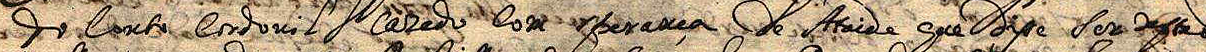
do Couto Cordouil cazado com sperança de Ataide que disse ser xptão
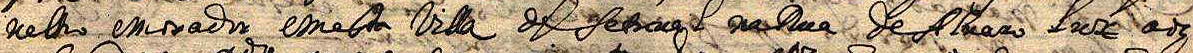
uelho e morador em esta Villa de Setuual na Rua de Aluaro Lux ao q
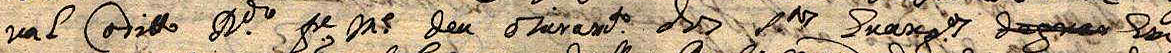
ual o ditto R.do p.e m.e deu o iuramto. dos s.tos Euang.os deguar Em
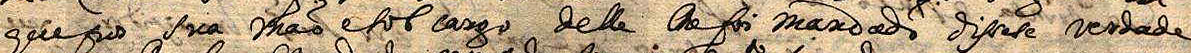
que pus sua maõ e sob cargo delle lhe foi mandado dissese verdade
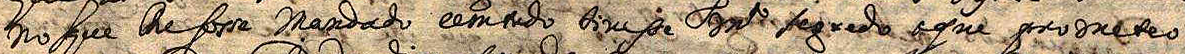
no que lhe fosse Mandado e em tudo tiuesse mto segredo o que prometeo
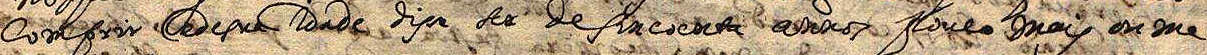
comprir e de sua Idade disse ser de sincoenta annos pouco mais ou me
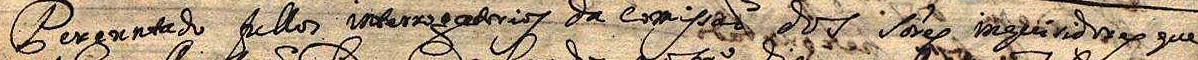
Perguntado pellos interrogatorios da comissaõ dos sorēs inquisidores que
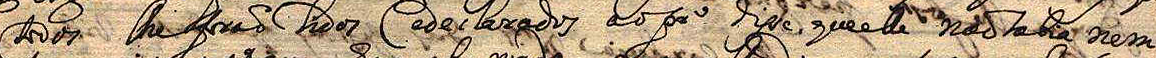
todos lhe foraõ lidos e declarados ao pro disse que elle naõ sabia nem
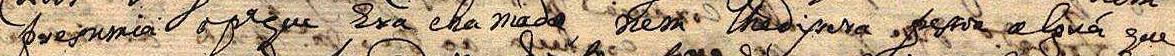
presumia o pa que Era chamado, nem lhe dissera pessoa alguā que
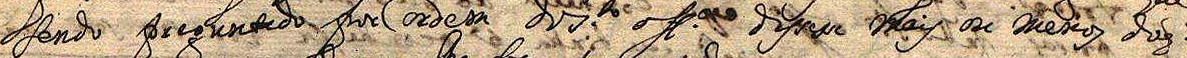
sendo preguntado por ordem do s.to off.o dissesse mais ou menos do q̄
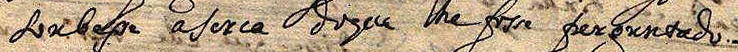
soubesse aserca do que lhe fosse perguntado.
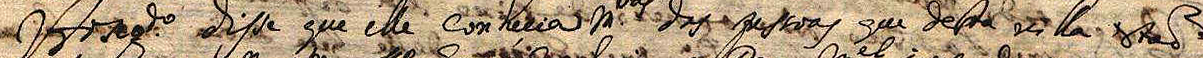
Ao seg.do disse que elle conheçia m.tas das pessoas que desta villa estaõ
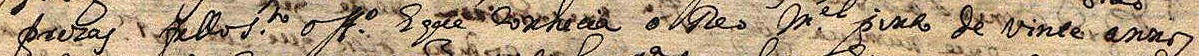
prezas pello s.to off.o E que conhecia o Reo M.el pinho de vinte annos
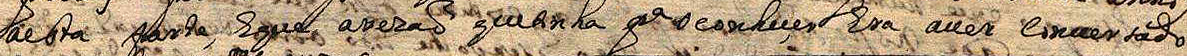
a esta parte, E que a rezaõ que tinha pa o conheçer Era auer conuersado
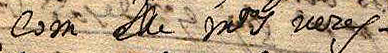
com elle mtas uezes
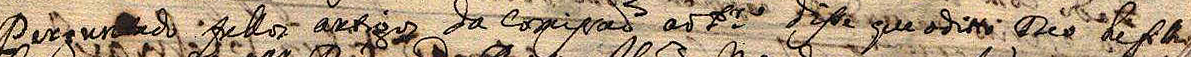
Perguntado pellos artigos da comissaõ ao p.ro disse que o ditto Reo he filho
